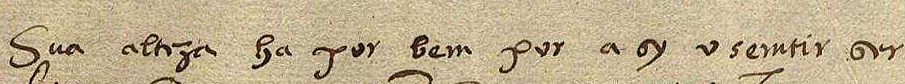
Sua alteza ha por bem por asy o semtir ser
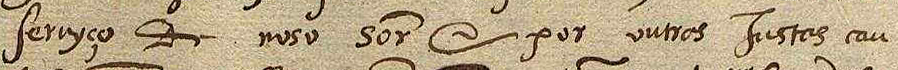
seruyço De noso sōr e por outras Justas cau
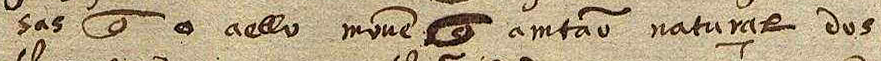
sas q̄ o a ello mōue q̄ amtão naturaL dos
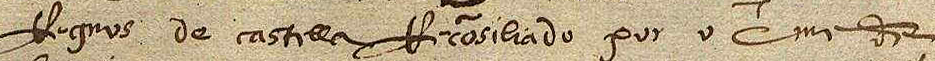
Regnos de castella Rec̄osiliado por o Cime de
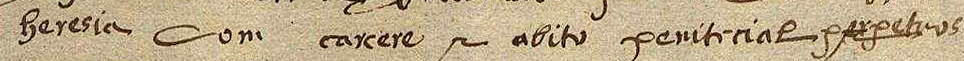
heresia Com carcere e abito penitecial perpetuos
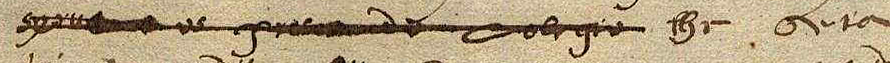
syrua os pres do Colegio lhe seia
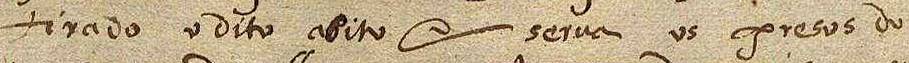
tirado o dito abito e serua os presos do
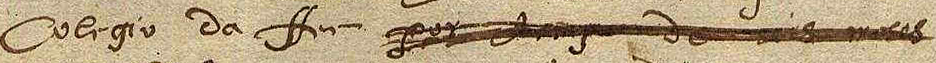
Colegio da ffee por tempo de seis meses
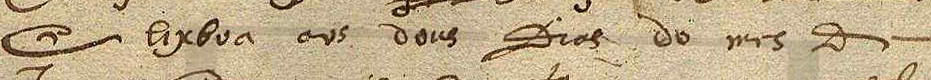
ē lixboa aos dous dias do mes de
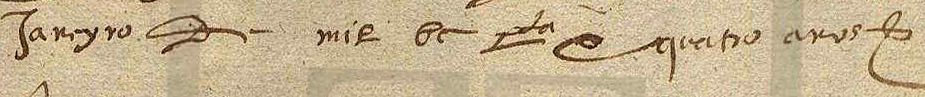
Janeyro de miL bc Lta e quatro anos
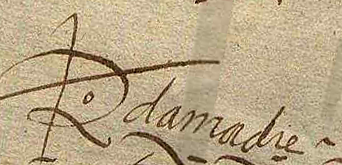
Ro da madre
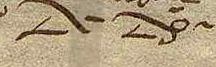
De Ds̄
